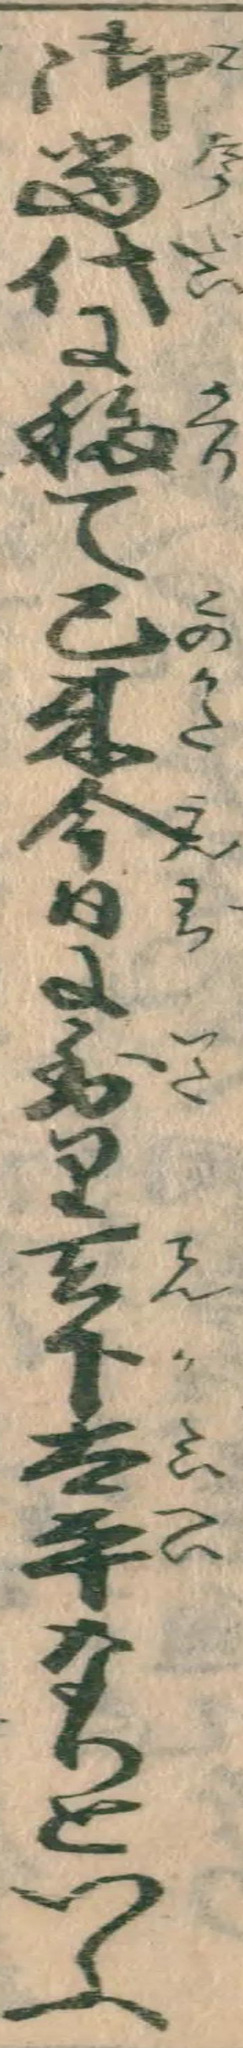御当代に移て已来今日に至り天下太平なりといふ
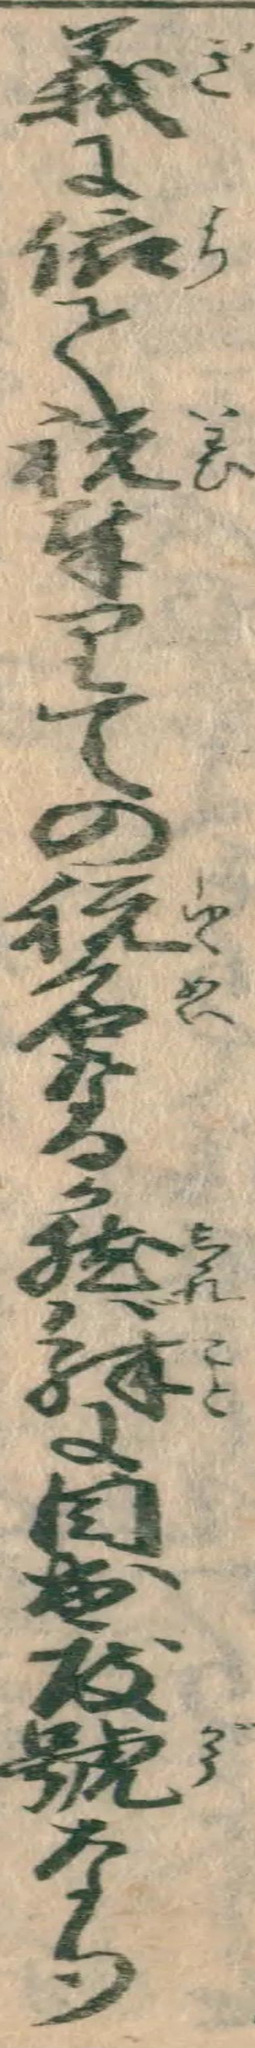義に依て祝奉りての祝名なるか然ば殊に目出度号なり
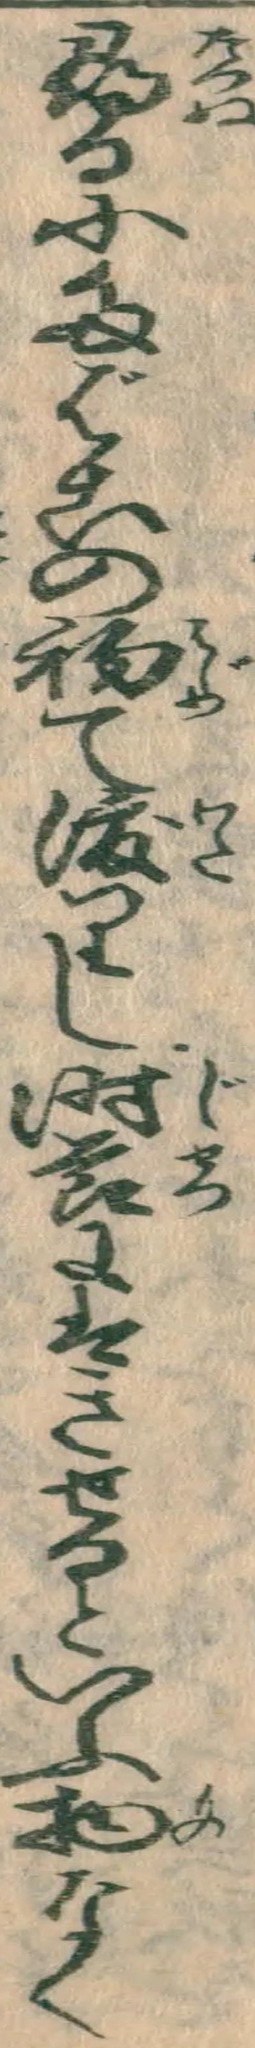尋るにたばこの初て渡りし時節にはきせるといふ物なく
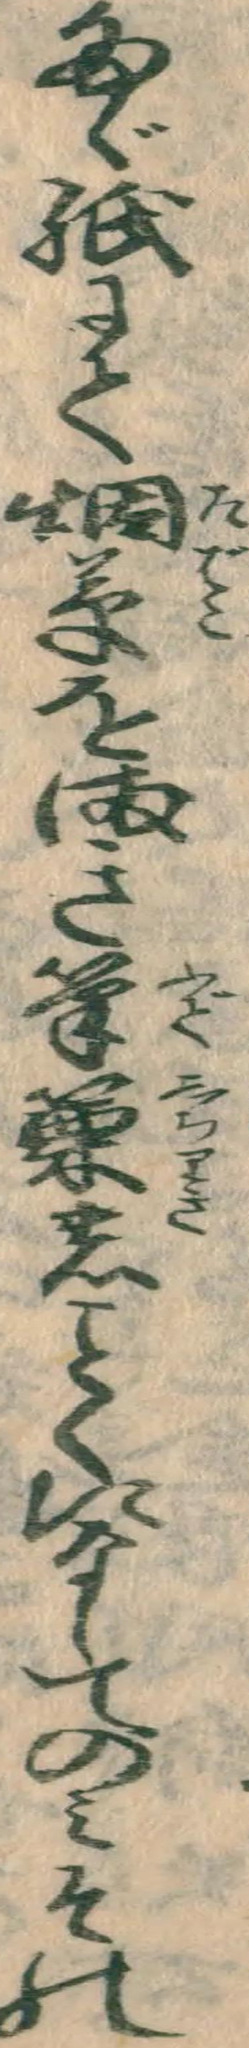たゞ紙にて烟草をまき筆篥のことくになしてのみその
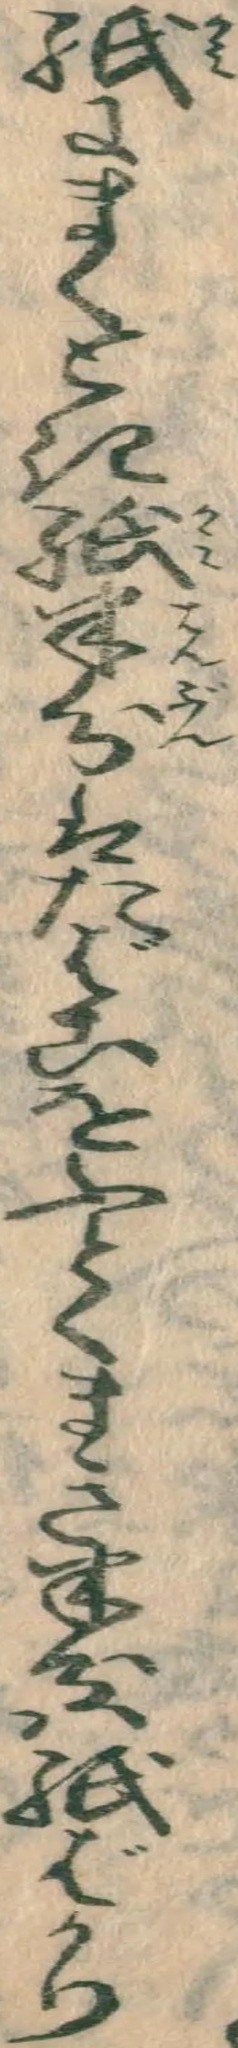紙にまくとき紙半分はたばこをふとくまき半分は紙ばかり
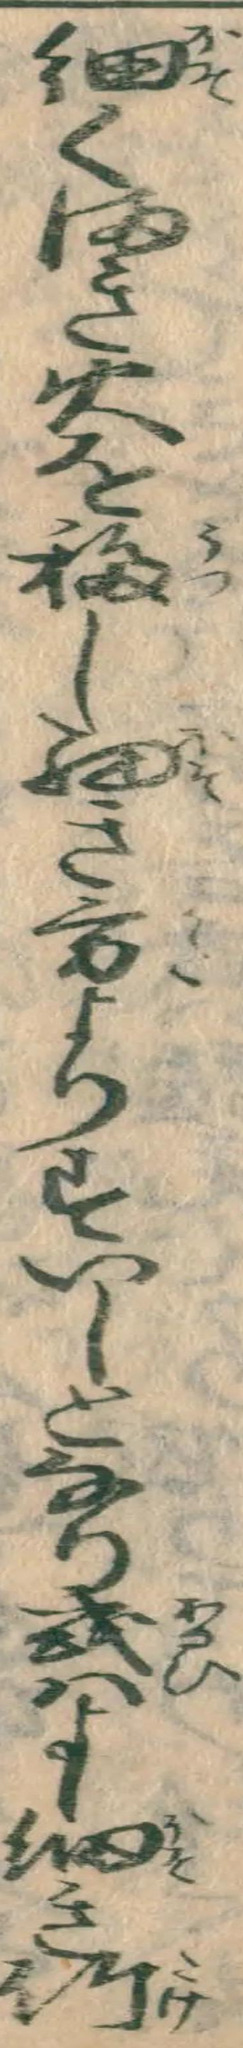細くまき火を移し細き方よりすいしとなり或はよし細き竹
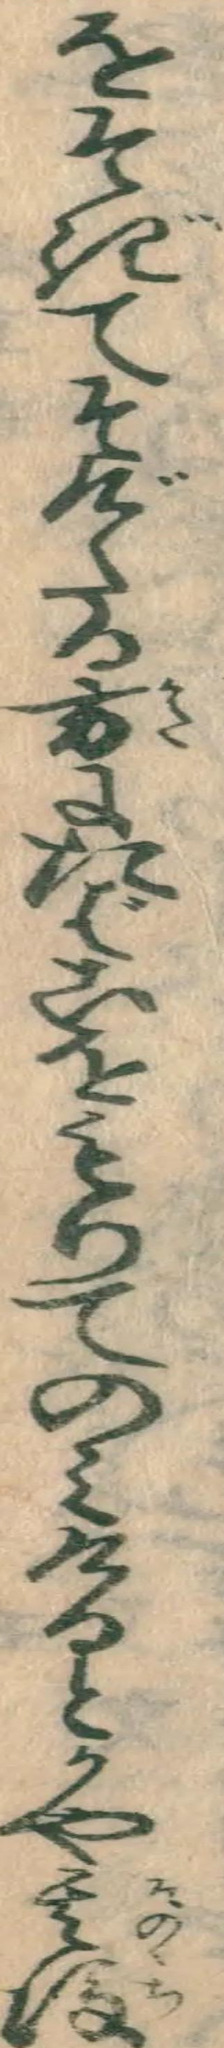をそぎてそげたる方にたばこをもりてのみけるとかや其後

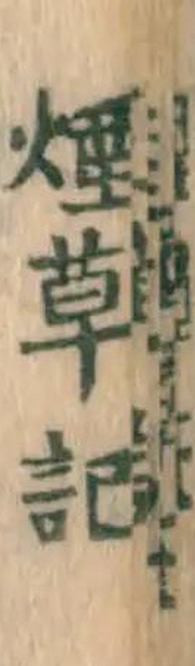煙草記
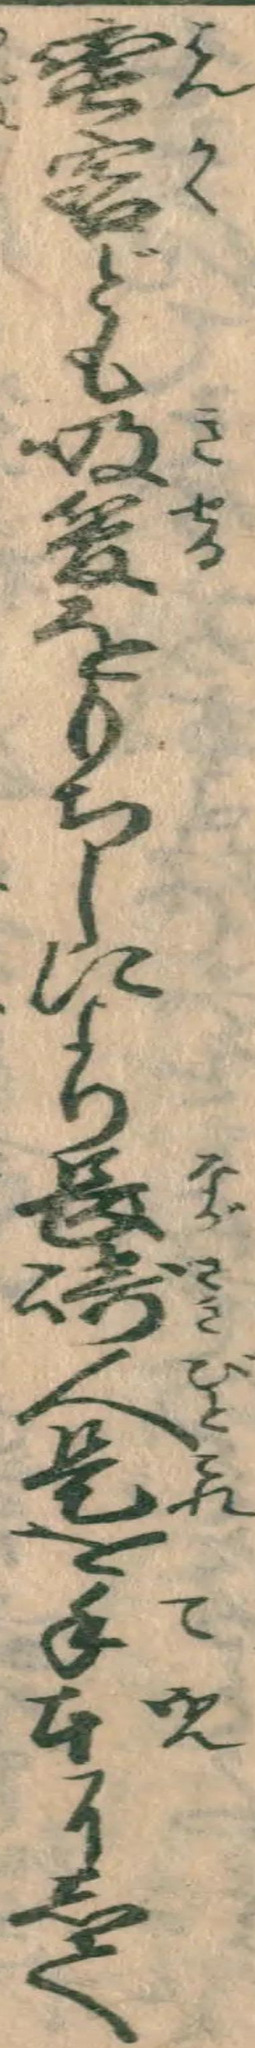蛮客ども吸管をもちしにより長崎人是を手本にして
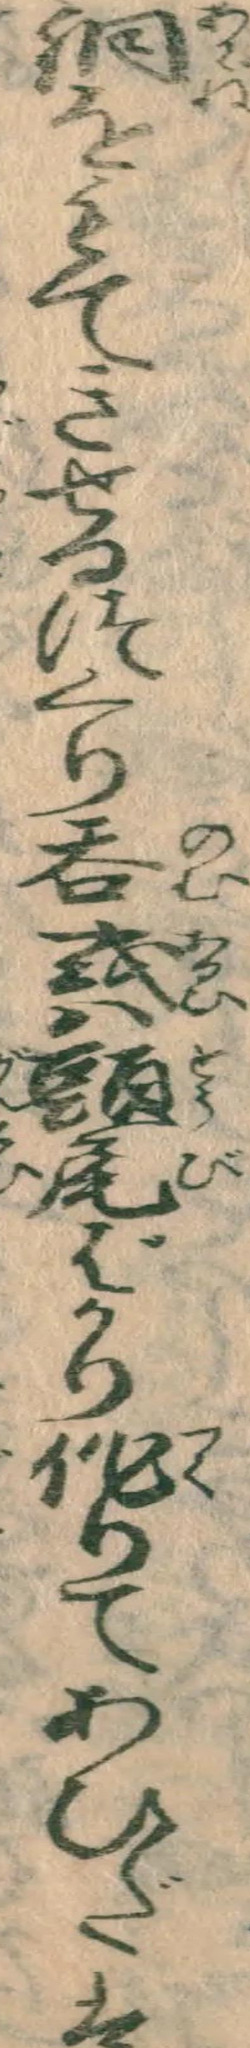銅をもてきせるつくり呑或は頭尾ばかり作りてあひだは
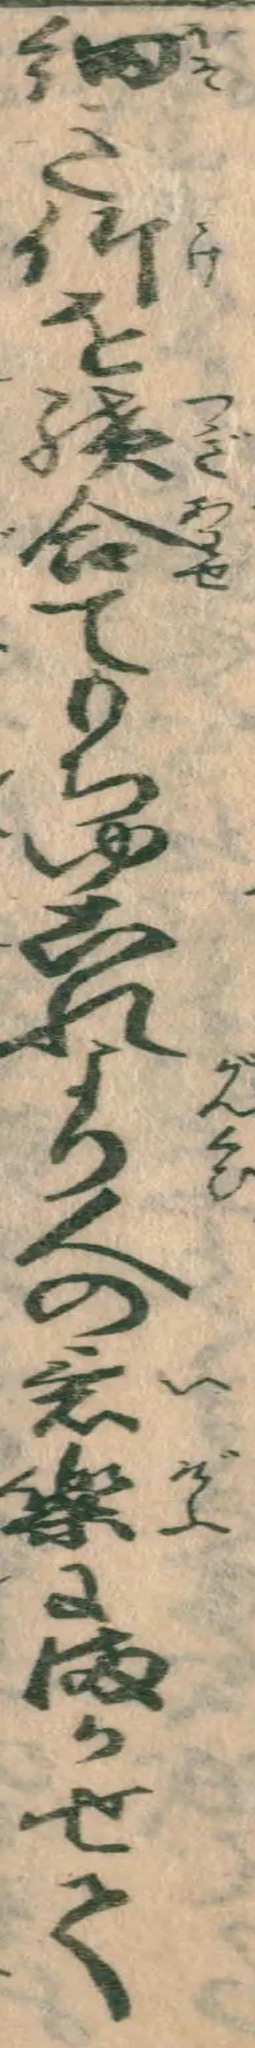細き竹を続合てもちゆこれより人の意楽にまかせて
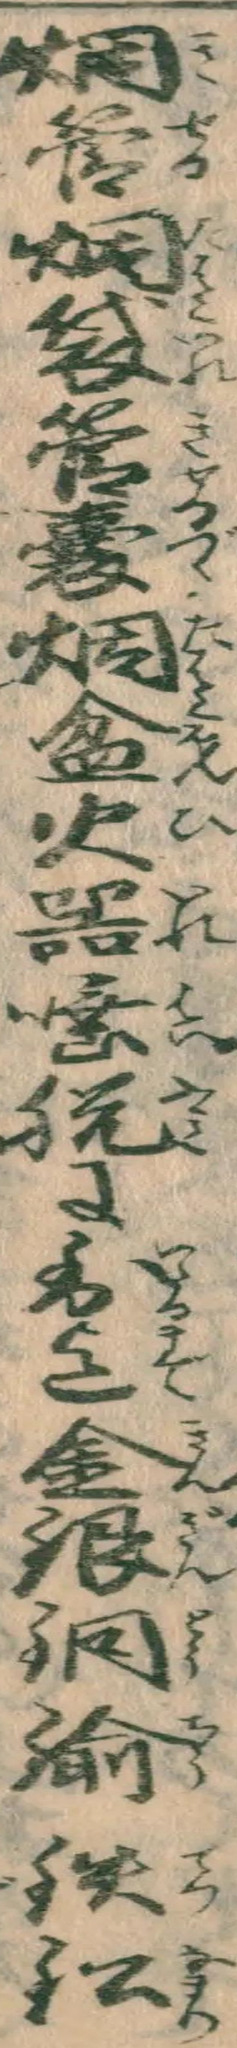烟管烟袋管嚢烟盆火器唾脱に至迄金銀銅鍮鉄鉛
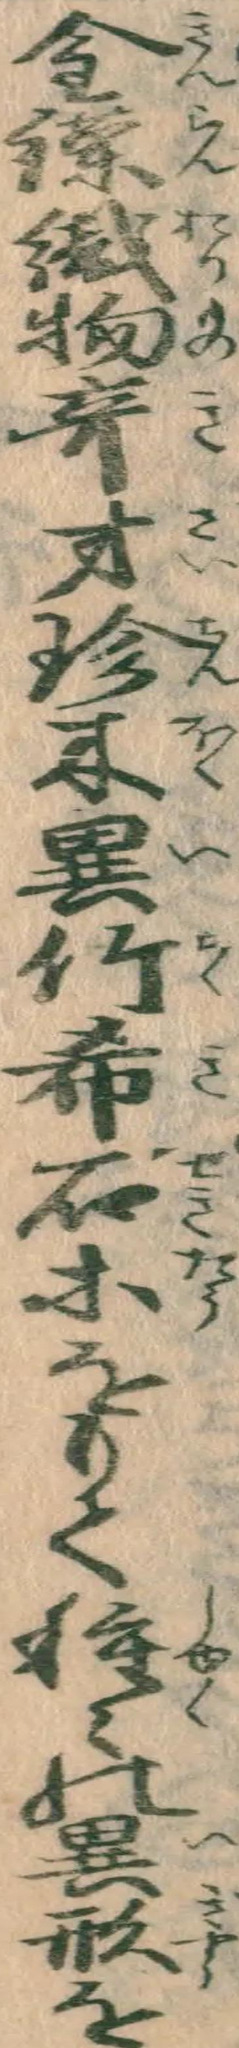金襴織物奇才珍木異竹奇石等をもて種々の異形を
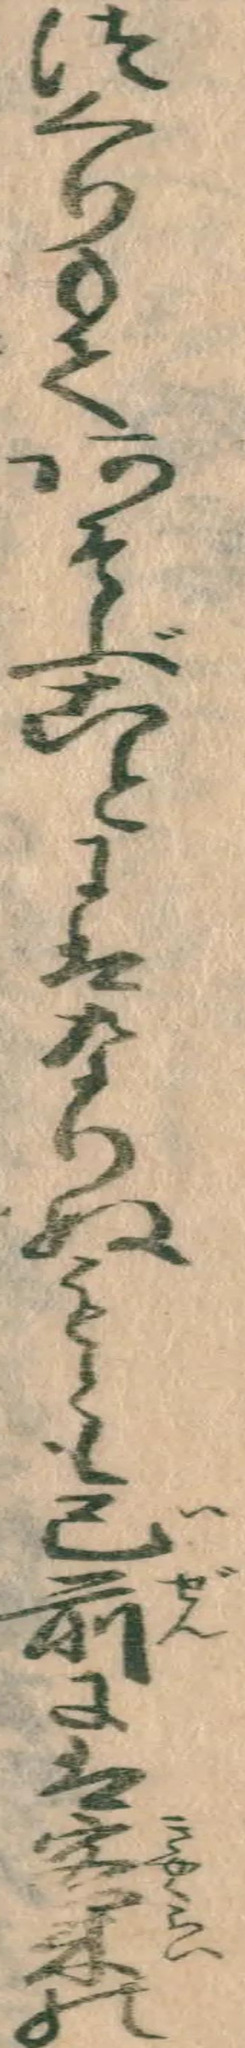つくりもてあそぶことにはなりぬもしも已前には客来の
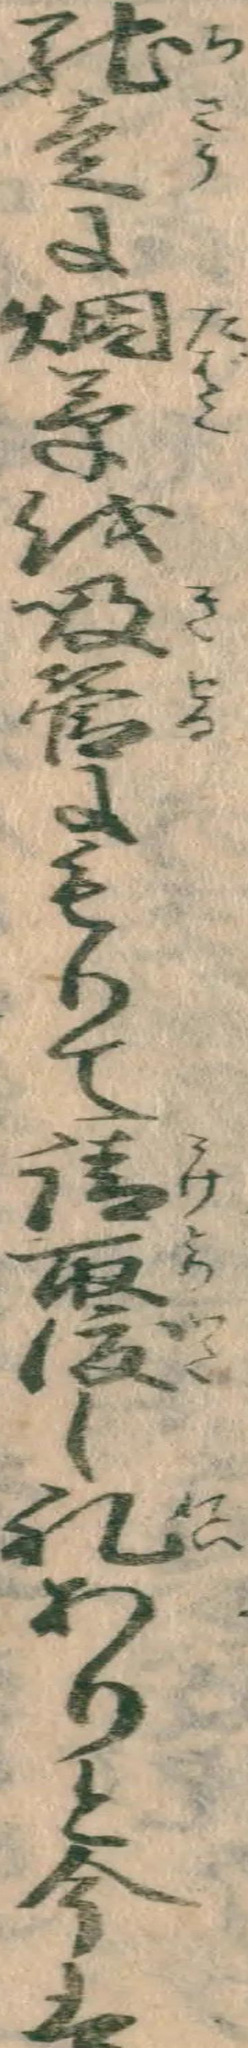馳走に烟草を吸管にもりて請取渡し礼ありと今は
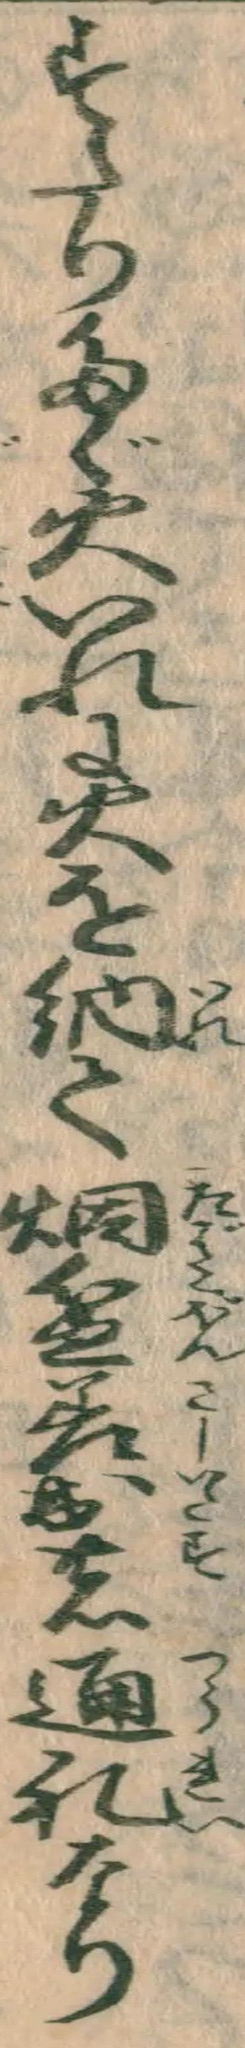すたりたゞ火いれに火を納て烟盆差出の通礼なり
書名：煙草記
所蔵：国立国会図書館 National Diet Library, JAPAN
